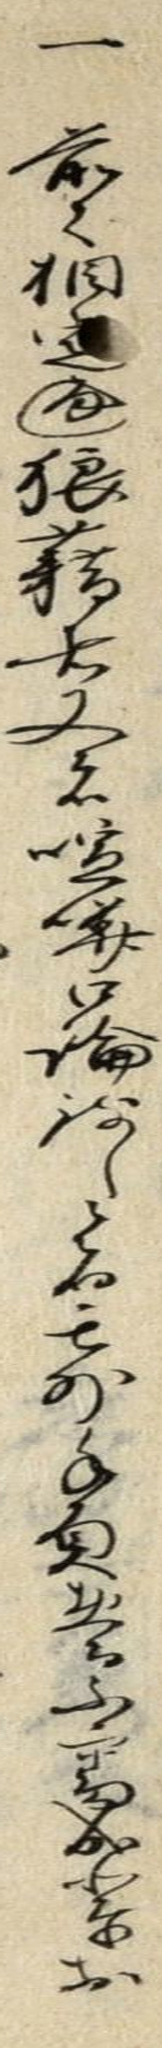一前々相定通狼藉者又者喧嘩口論致し候者其外手負惣て不審成輩於
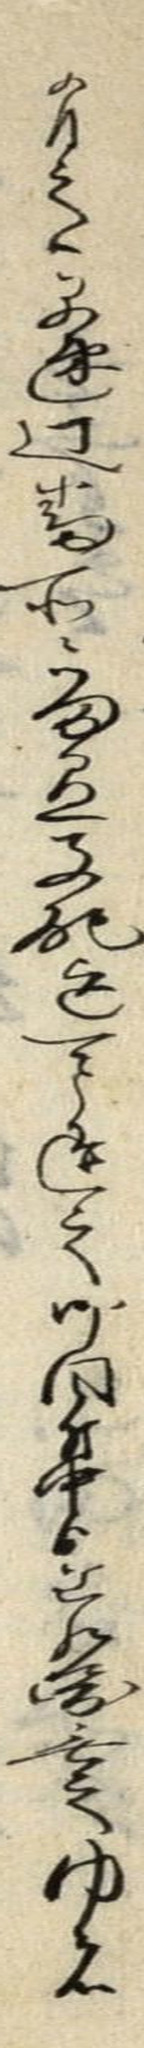有之は早速辻番所に留置支配迄可申達之御目付中ゟ差図無之内は
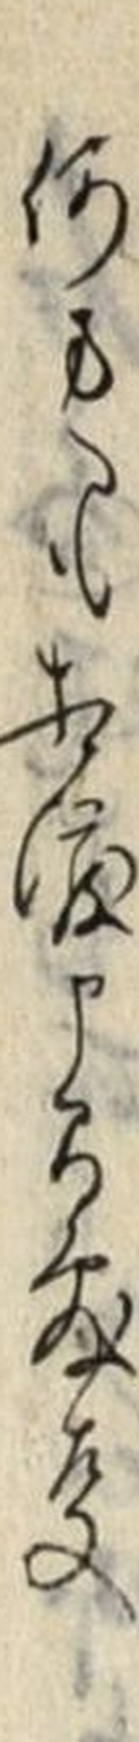何方へも相渡申間敷事
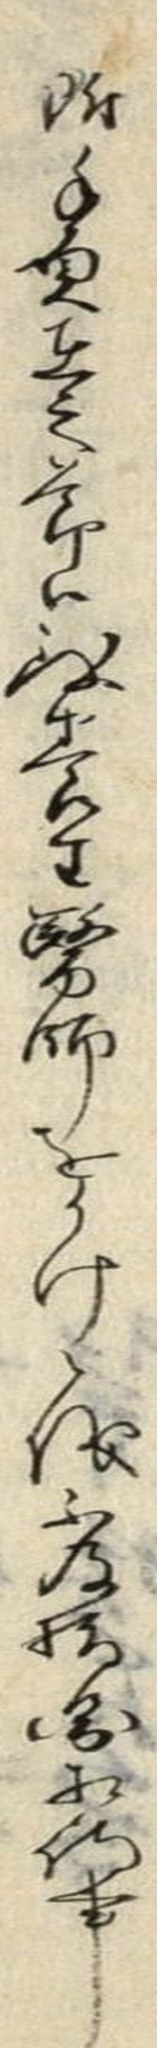附手負在之節は致養生医師をうけ候儀不及指図相待事
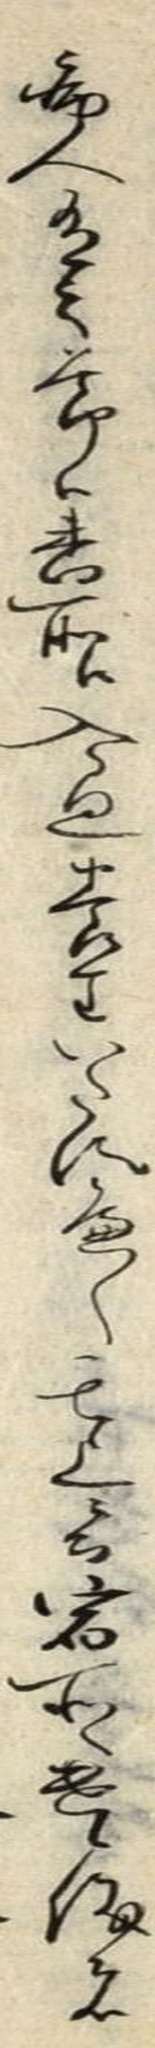一病人有之節は番所江入置養生いたすへし其上にて宿所へ遣候儀は
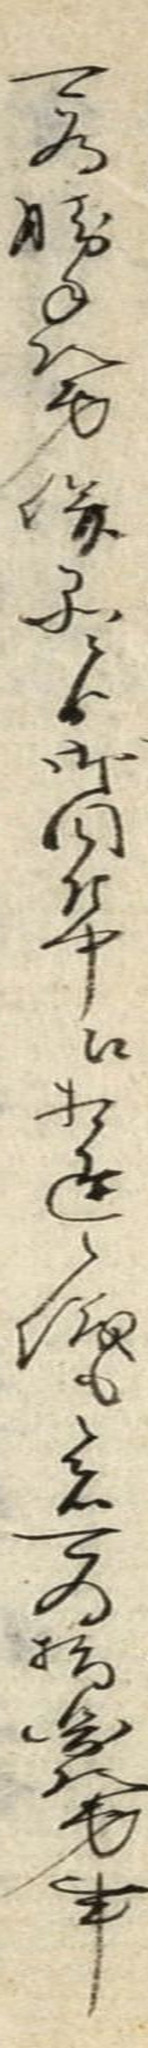可為勝手次第併品にゟ御目付中江相達候儀も候は可為指図次第事
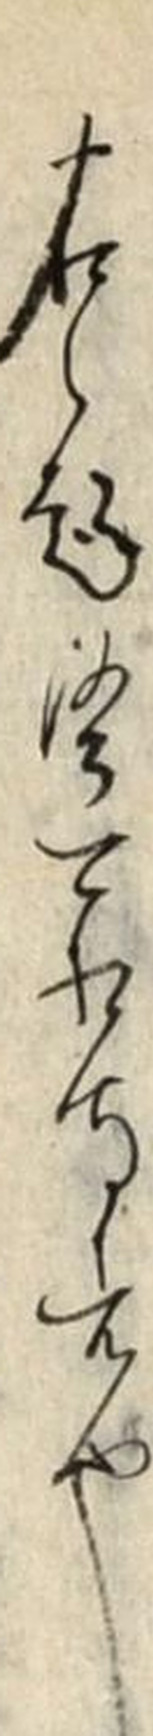右之趣堅可相守者也
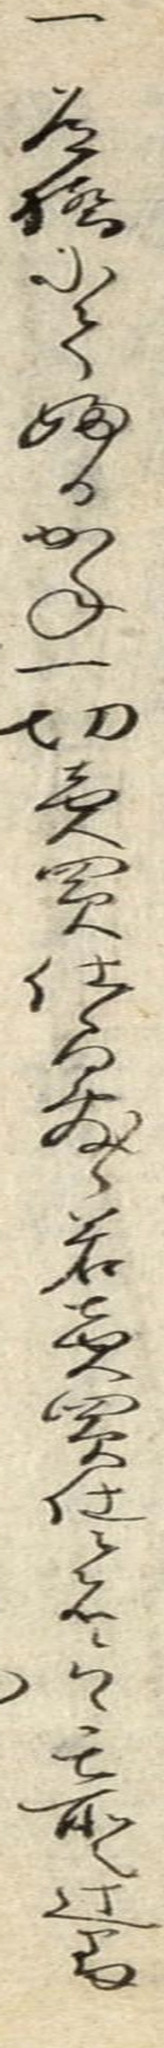一道橋にてふるかね一切売買仕間敷候若売買仕候者候はゝ其所之辻番
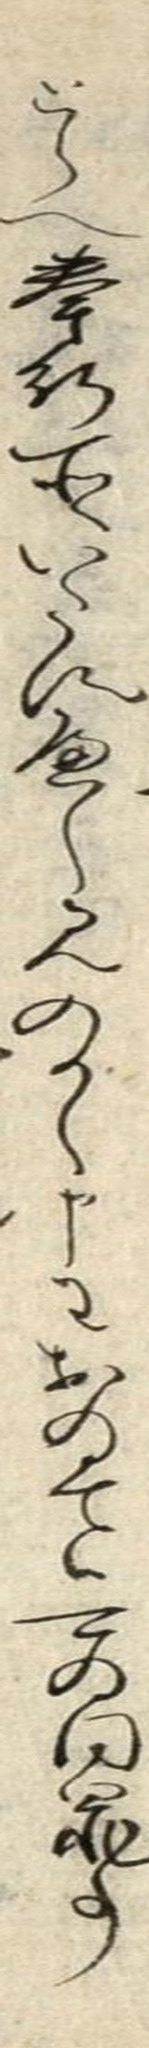とらへ奉行所へいたすへし見のかし申におゐては可為同罪事
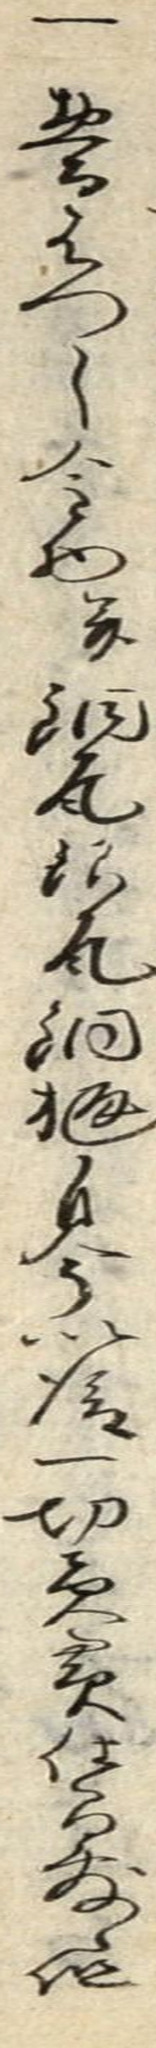一惣てはつし金物幷銅瓦鉛瓦銅樋自今以後一切売買仕間敷候但
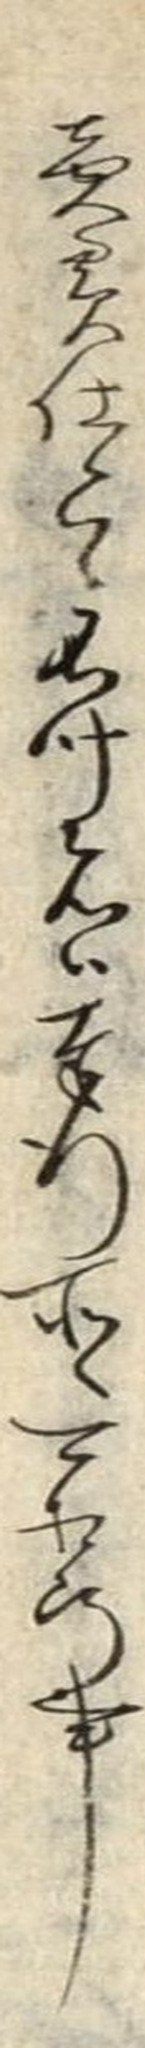売買仕候はゝ不叶者は奉行所へ可相断事
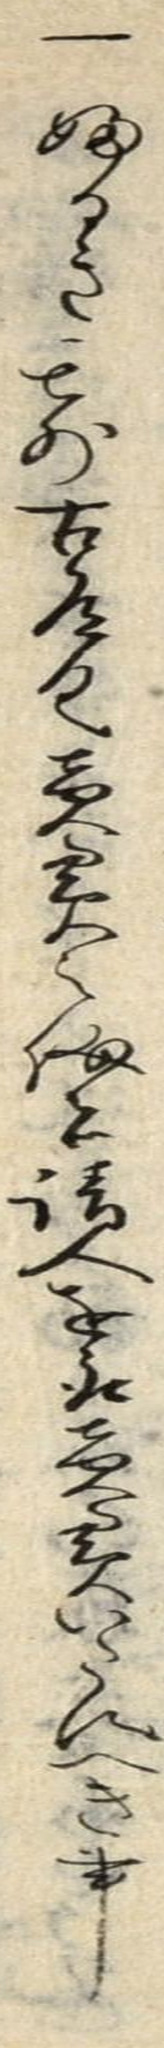一ふるき其外古道具売買之儀は請人を取売買いたすへき事
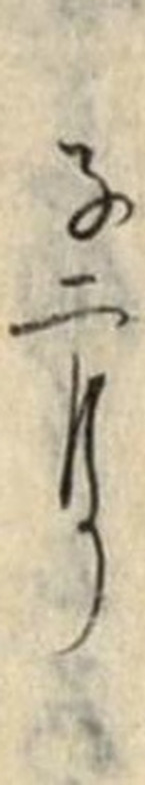子二月

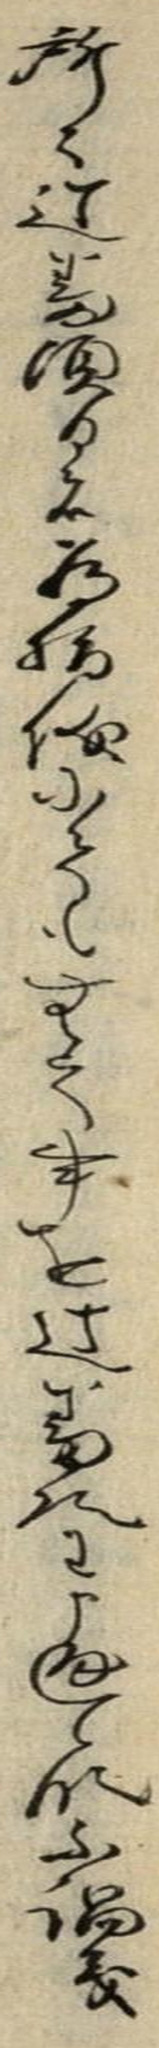所々辻番頃日は為指儀にても無之事を辻番頭に申通段不誤義
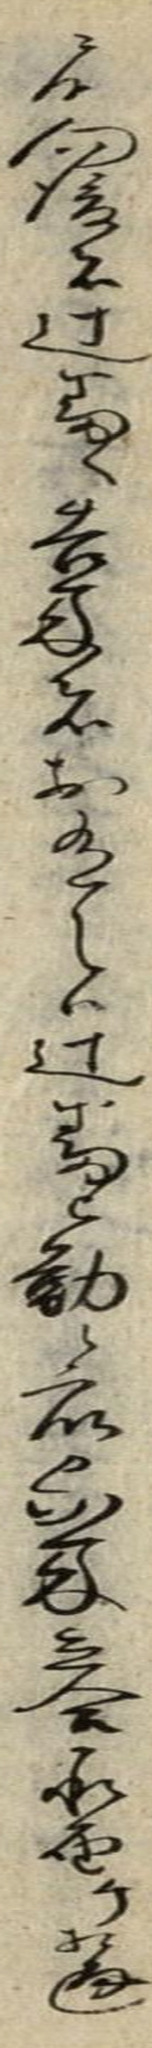に候向後は辻番へ告来者於有之は辻番被勤候衆家来立会承届ケ相通
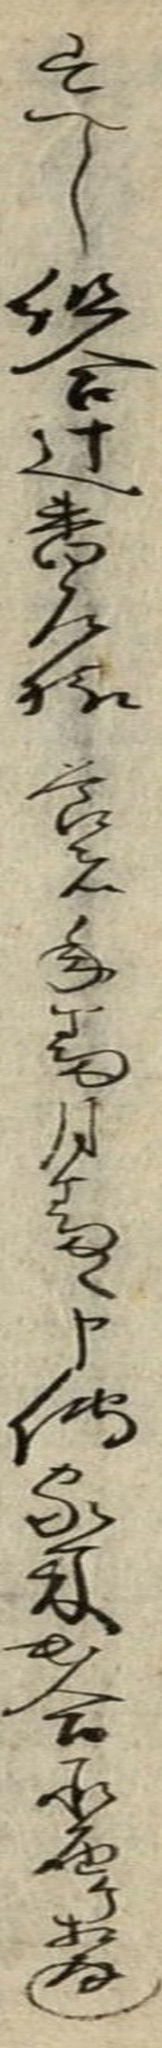すへし組合辻番左様節は年番月番へ申伝家来出合承届ケ相通
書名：三都并道中之部
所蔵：福井県文書館 Fukui Prefectural Archives
